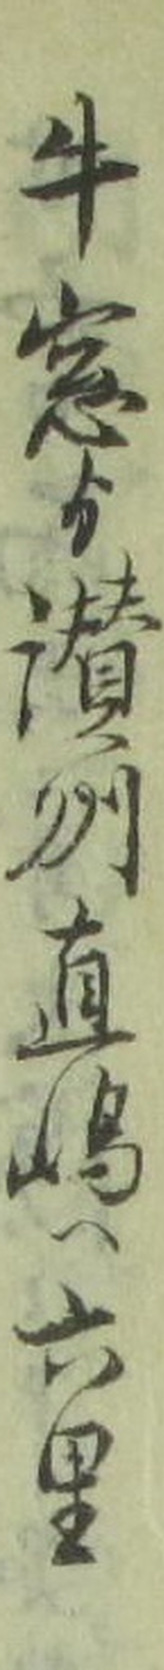牛窓ゟ讃州直嶋へ六里
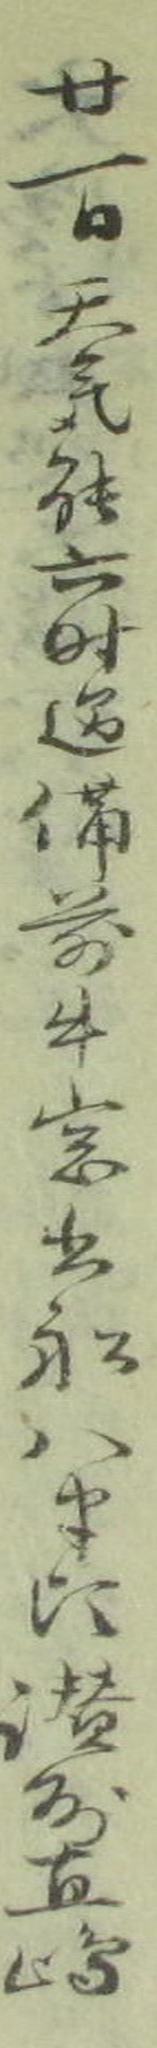廿一日天気能六時過備前牛窓出船八半頃讃州直嶋
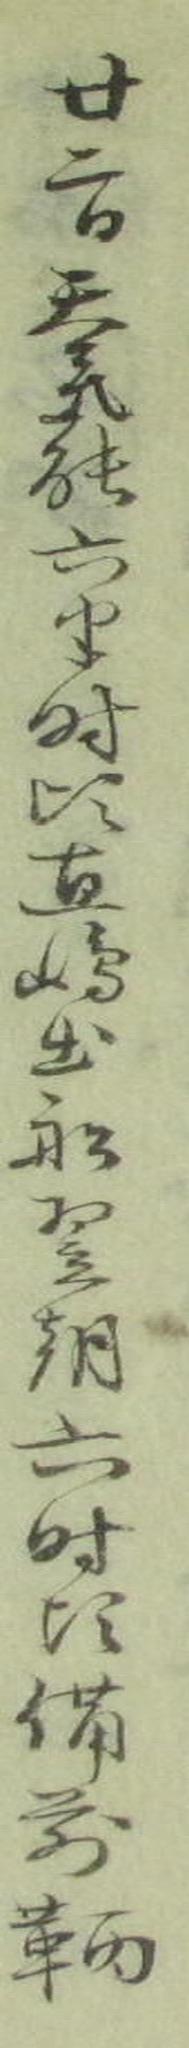廿二日天気能六半時頃直嶋出船翌朝六時頃備前鞆
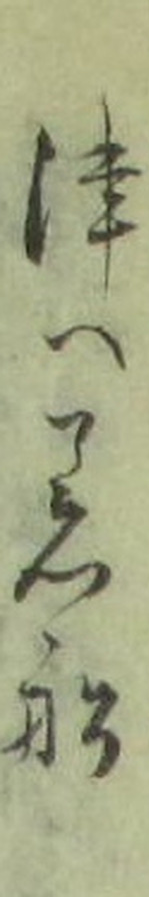津へ着船
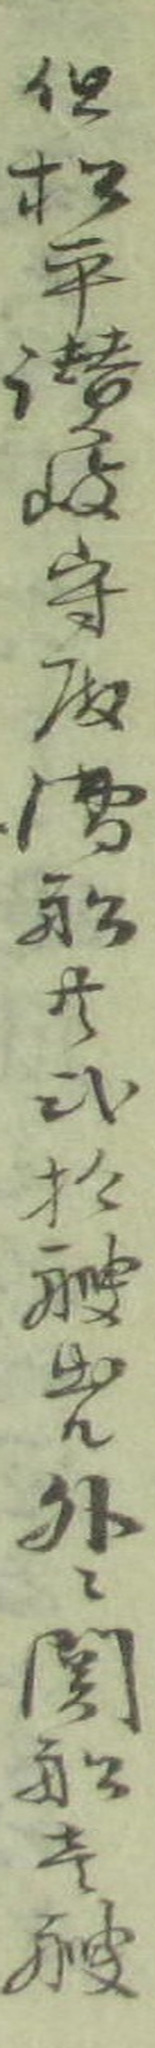但松平讃岐守殿漕船共弐拾艘出ル外に関船壱艘
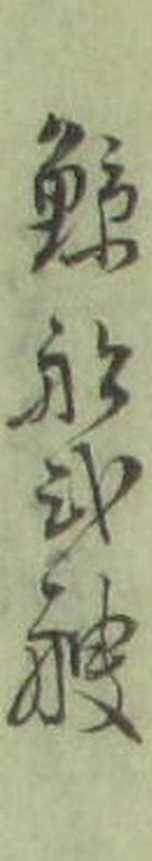鯨船弐艘
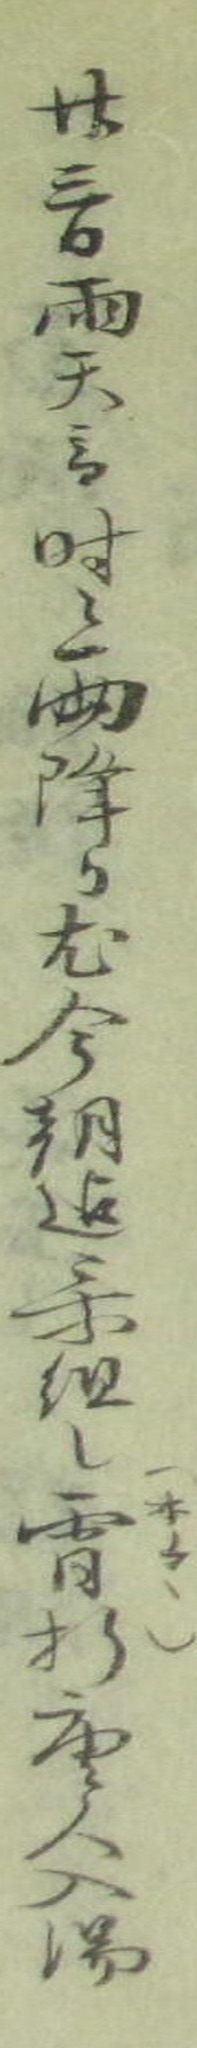廿三日雨天に而時々雨降り尤今朝迄乗組し宵折唐人入湯
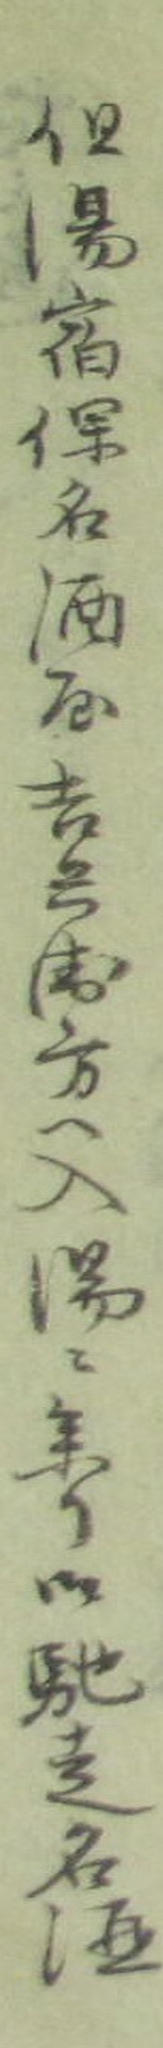但湯宿保名酒屋吉兵衛方へ入湯に集り候馳走名酒

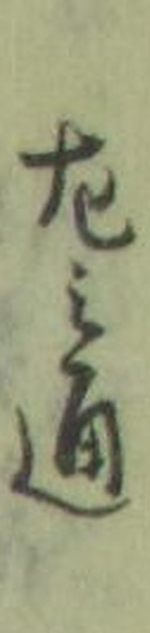左之通
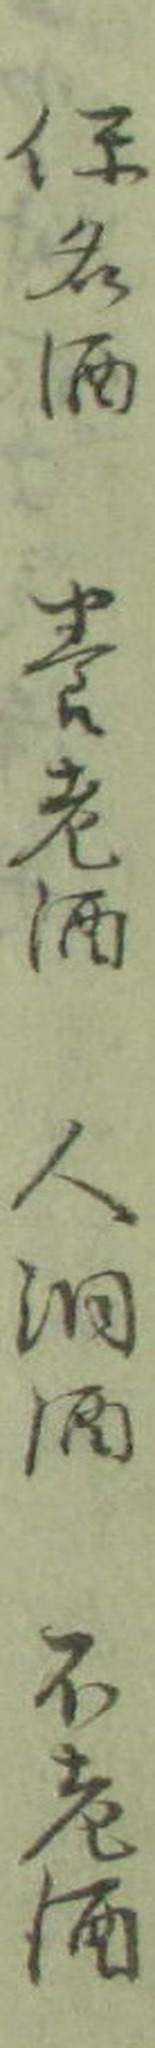保名酒養老酒人泪酒不老酒
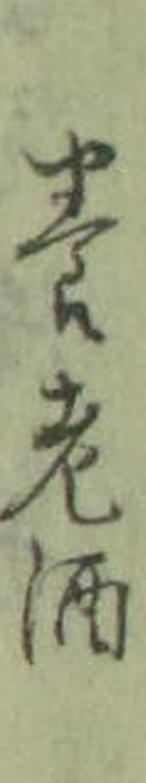養気酒
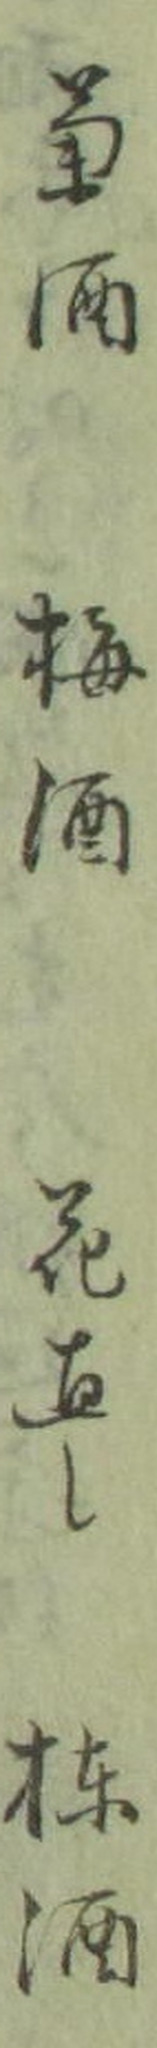菊酒梅酒花直し棟酒
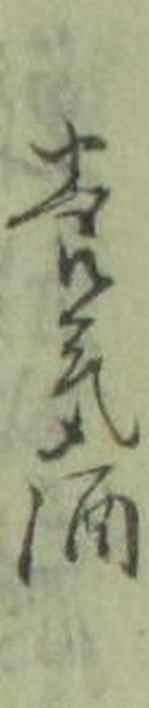養気酒
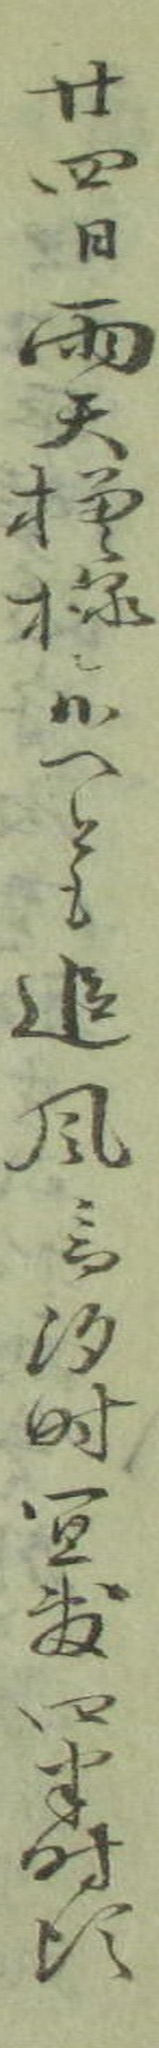廿四日雨天模様に候へとも追風に而汐時宜敷四半時頃
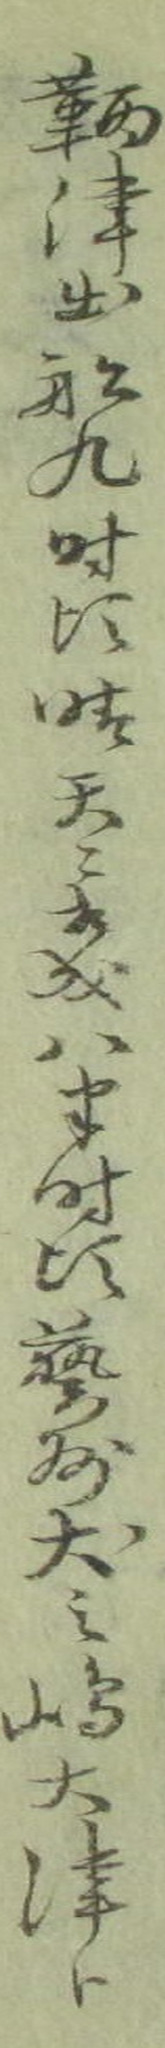鞆津出船九時頃晴天に相成八半時頃芸州大三島大津ト
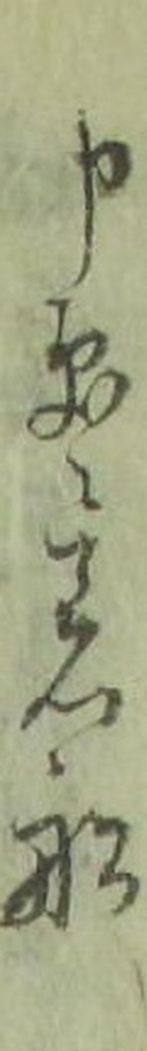申処に着船
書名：紀州九木浦庄屋記録 四
